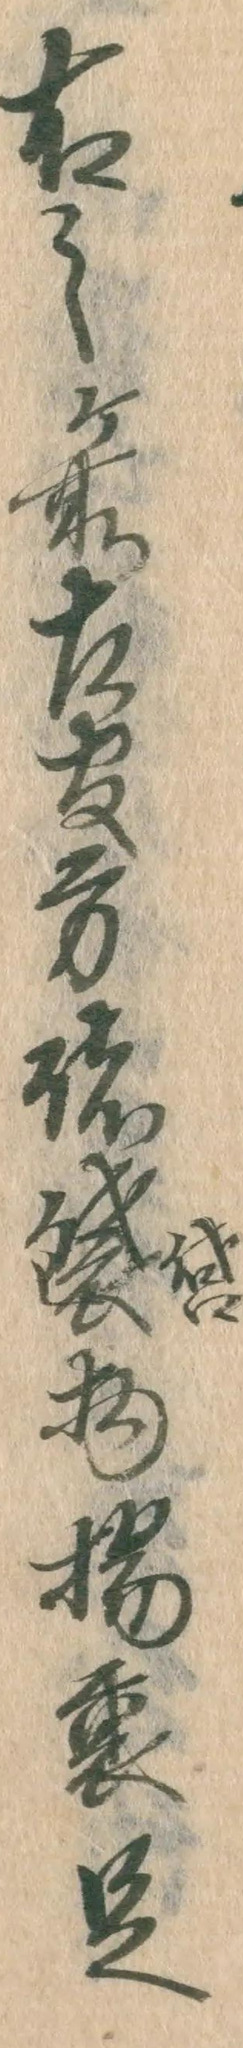右之ケ所左官方諸袋物揚裏足
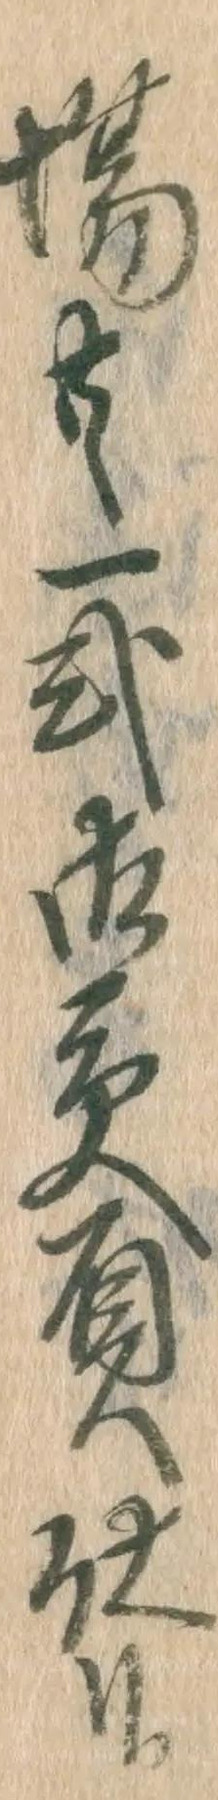場共一式御受負仕候
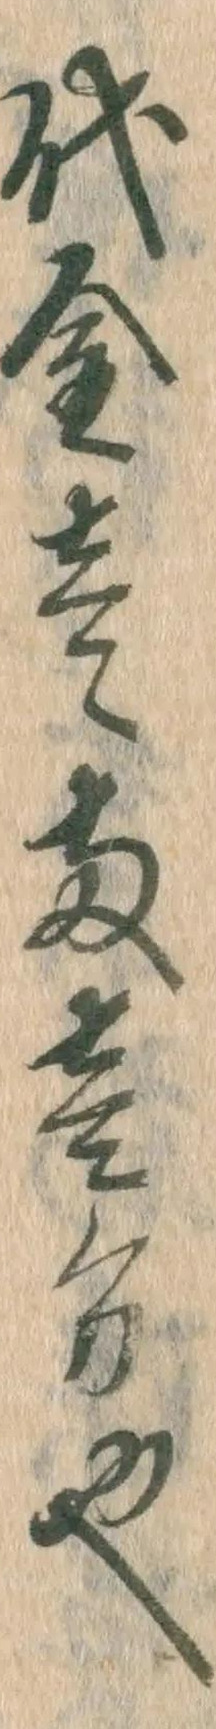代金壱両壱分也
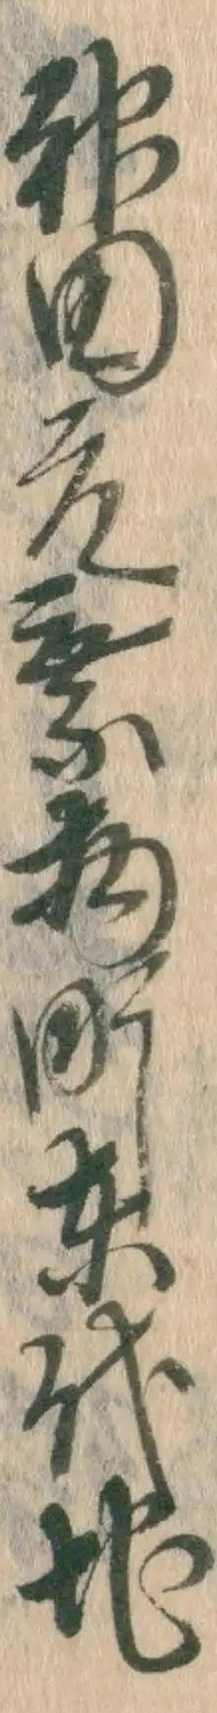神田元乗物町東代地
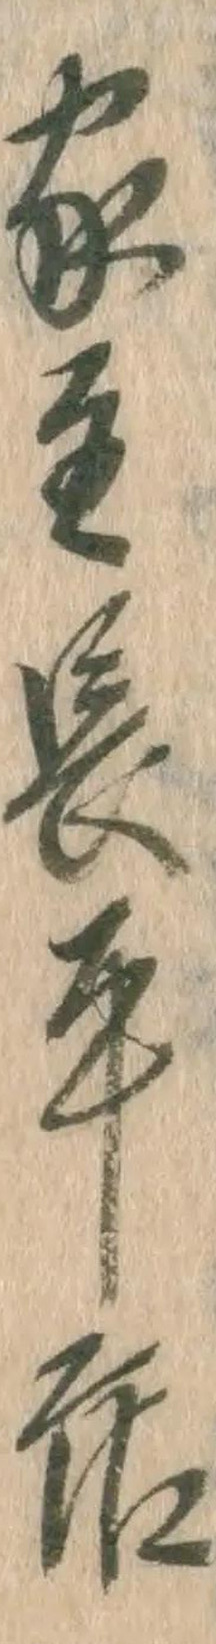家主長平店
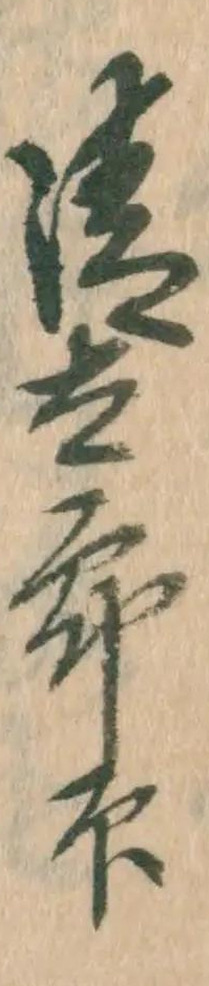清太郎印
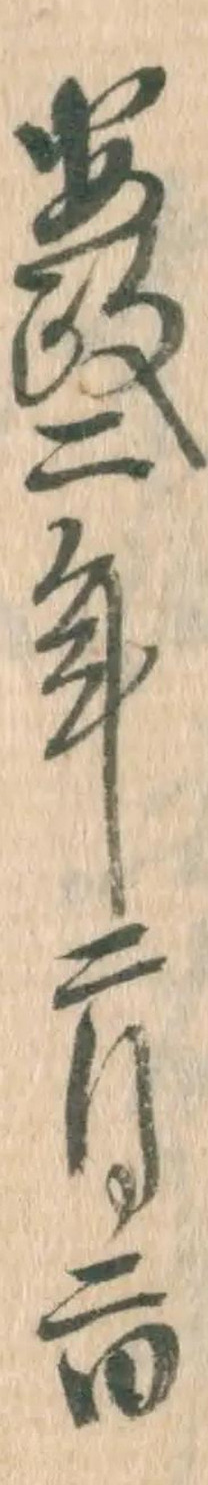安政二年二月二日
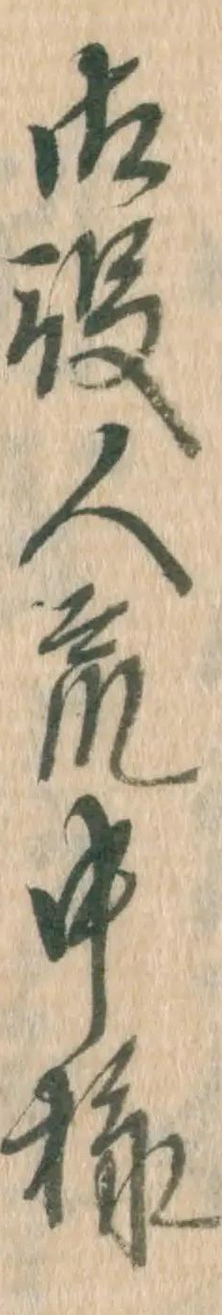御役人衆中様

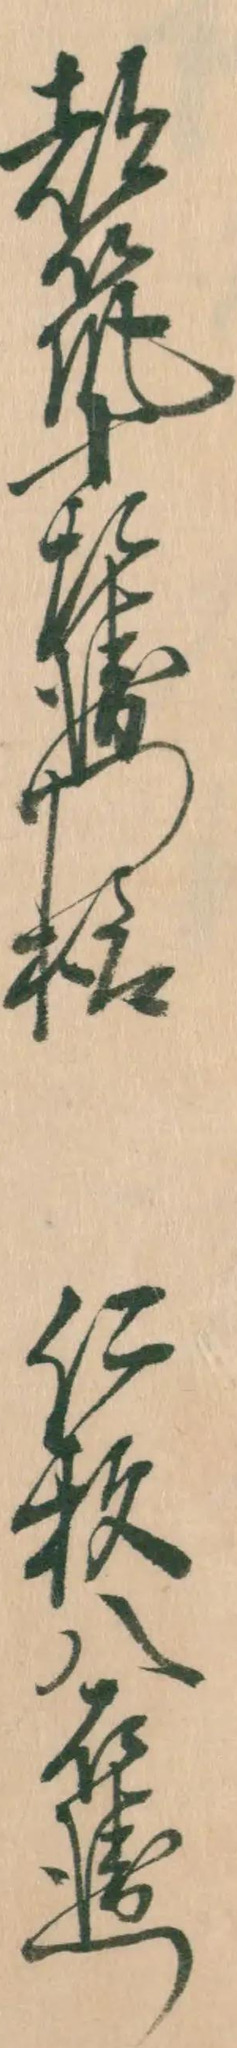都筑十左衛門様仁杉八右衛門
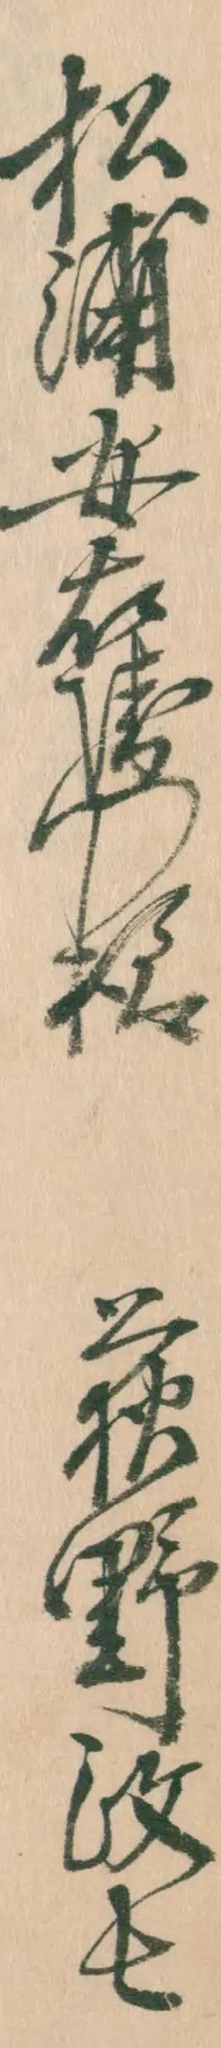松浦安右衛門様荻野政七
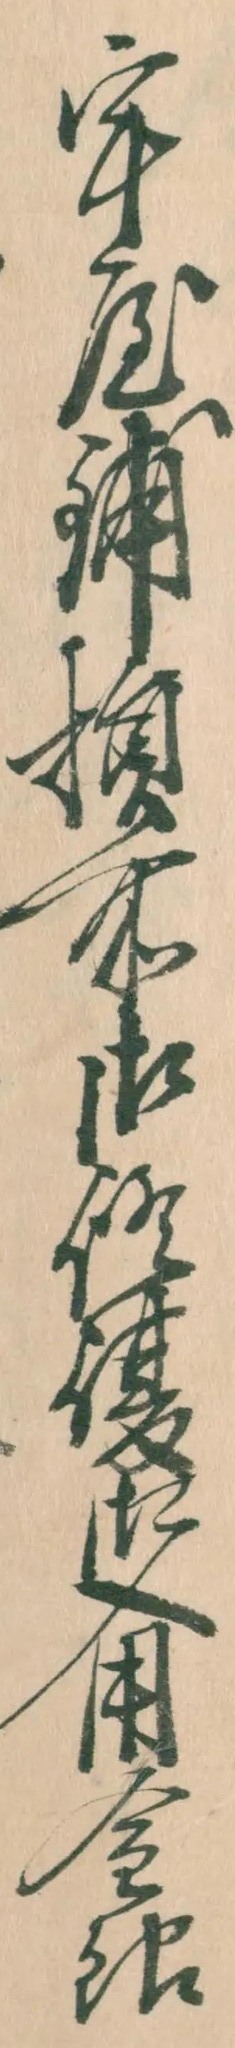牢屋敷損所御修復御入用金銀
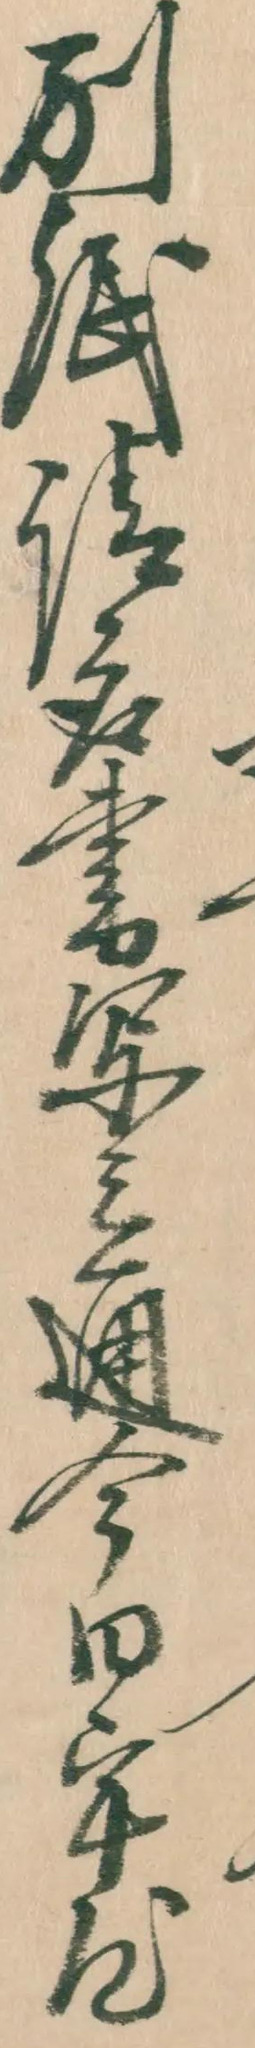別紙請取書写之通今日牢屋
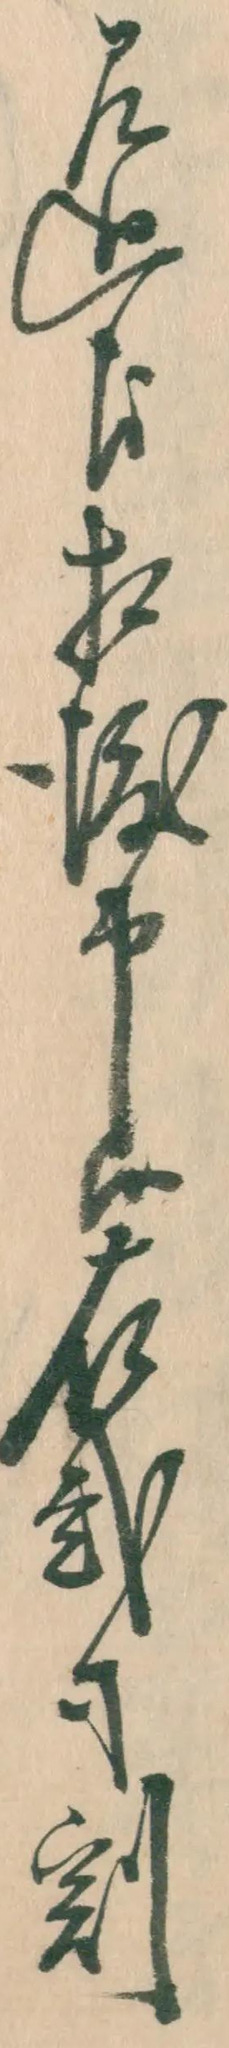見廻え相渡申候右弐ツ割
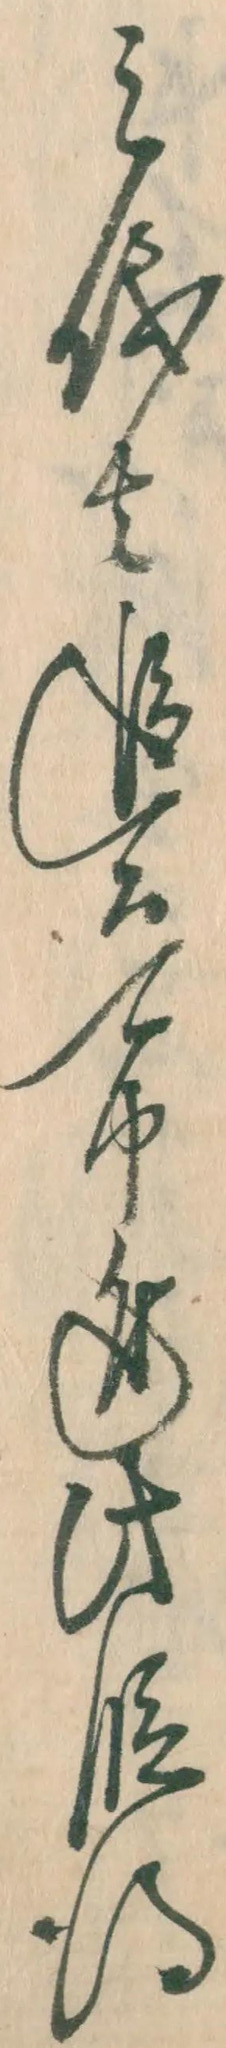之儀は追て可申進此段得
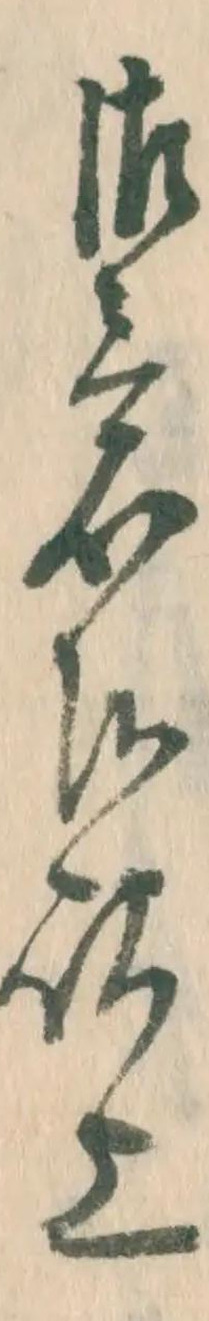御意候以上

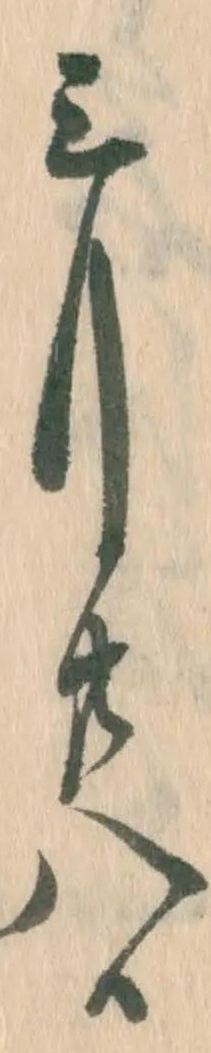三月廿八日
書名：七十冊物類集 71巻. [44] 四十三 牢屋敷御普請御修覆地震ニ付骨折候牢屋掛御褒美之部
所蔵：国立国会図書館 National Diet Library, JAPAN
